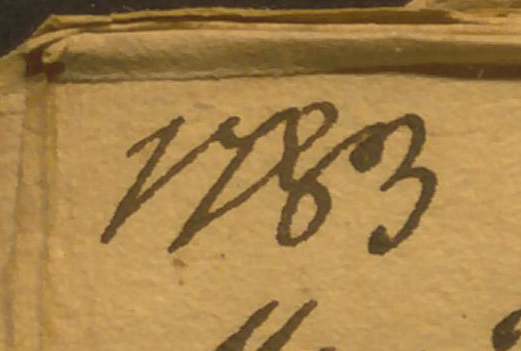1783
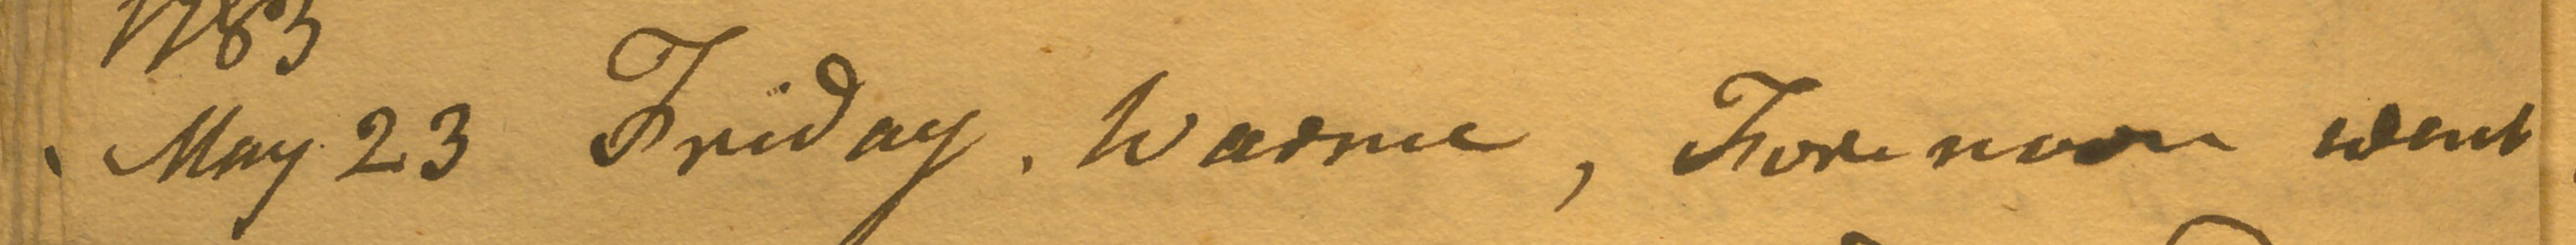May 23 riday, warme, Forenoon went
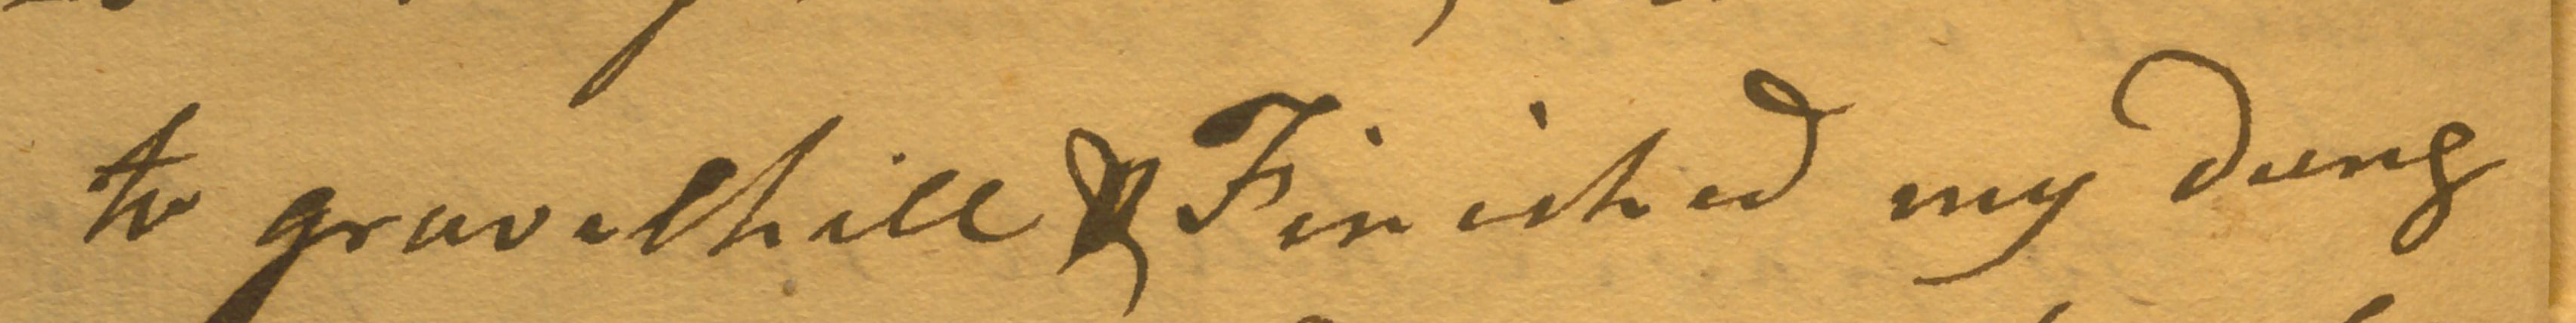to gravelhill & Finished my dung
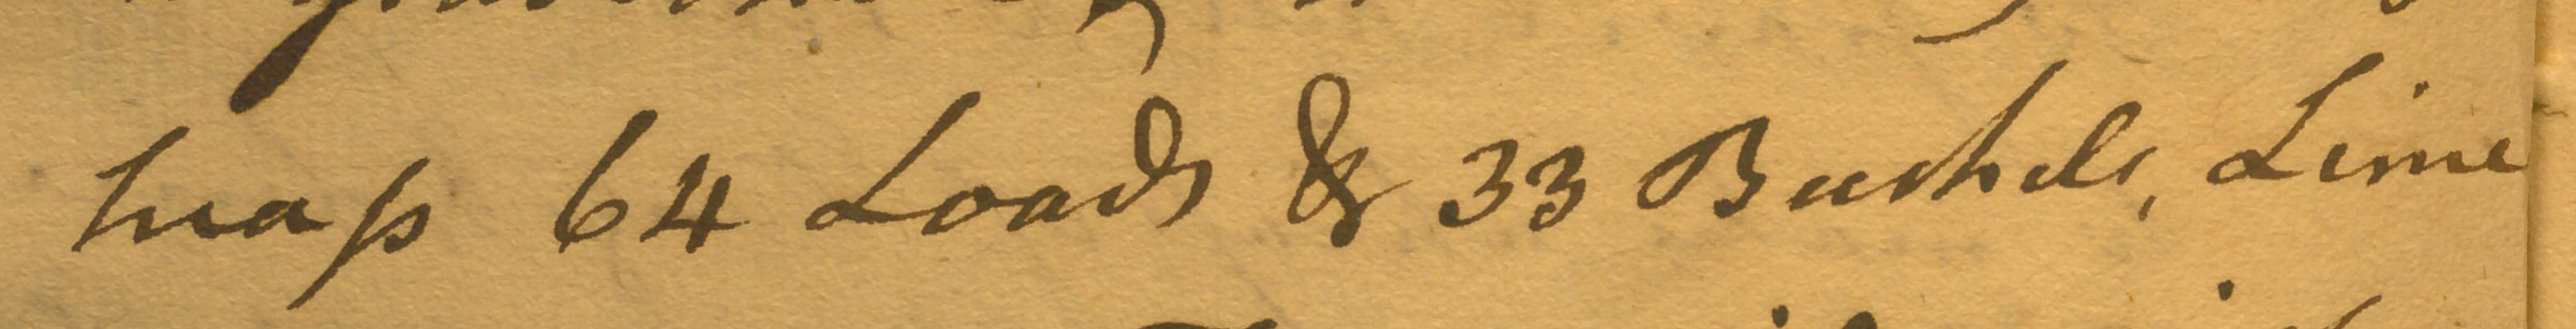hap 64 Loads & 33 Bushels, Lime
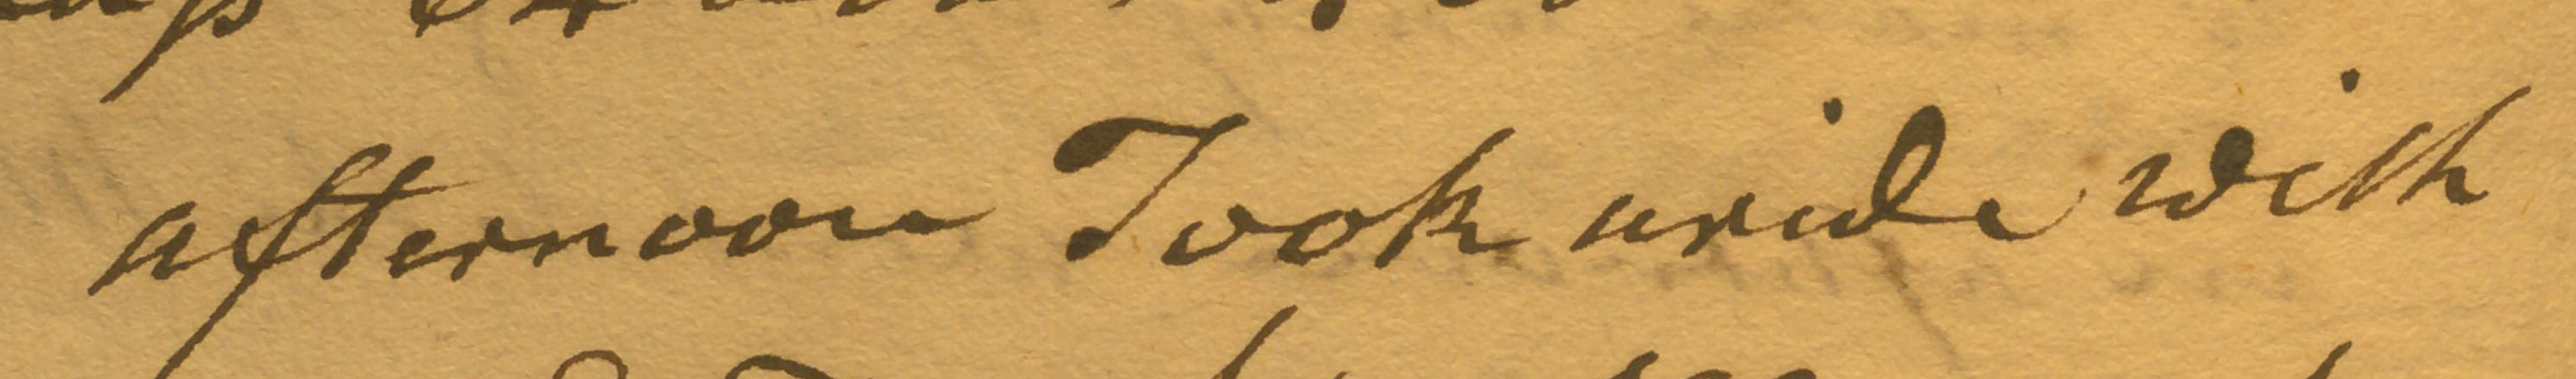afternoon Took a ride with
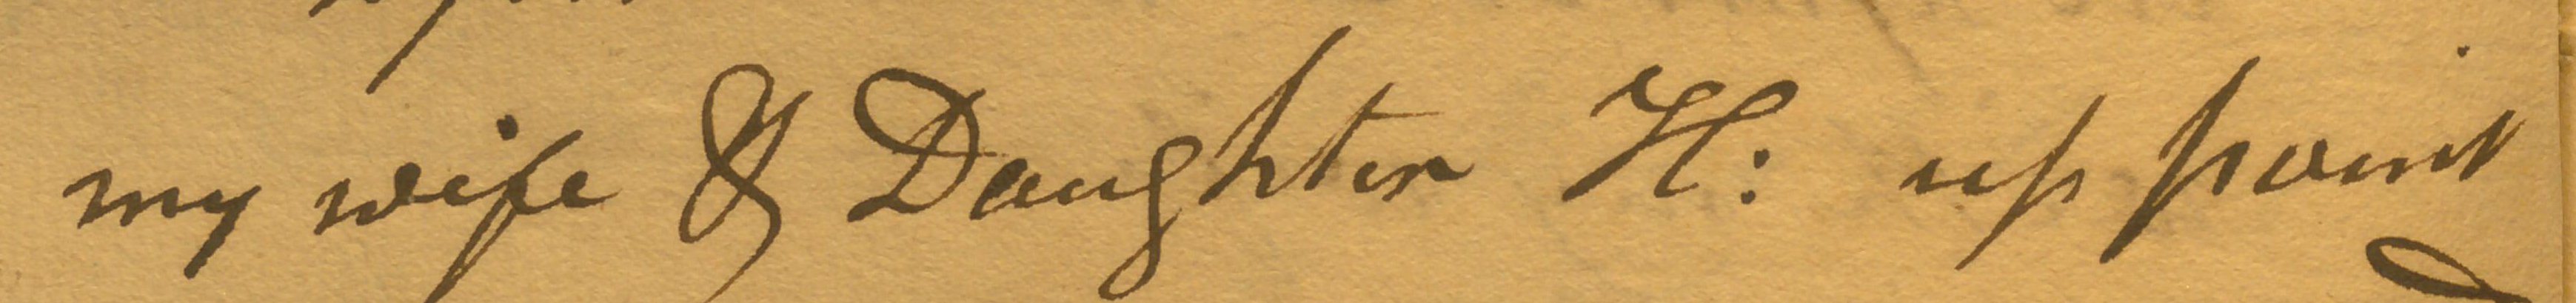my wife & Daughter H: up point
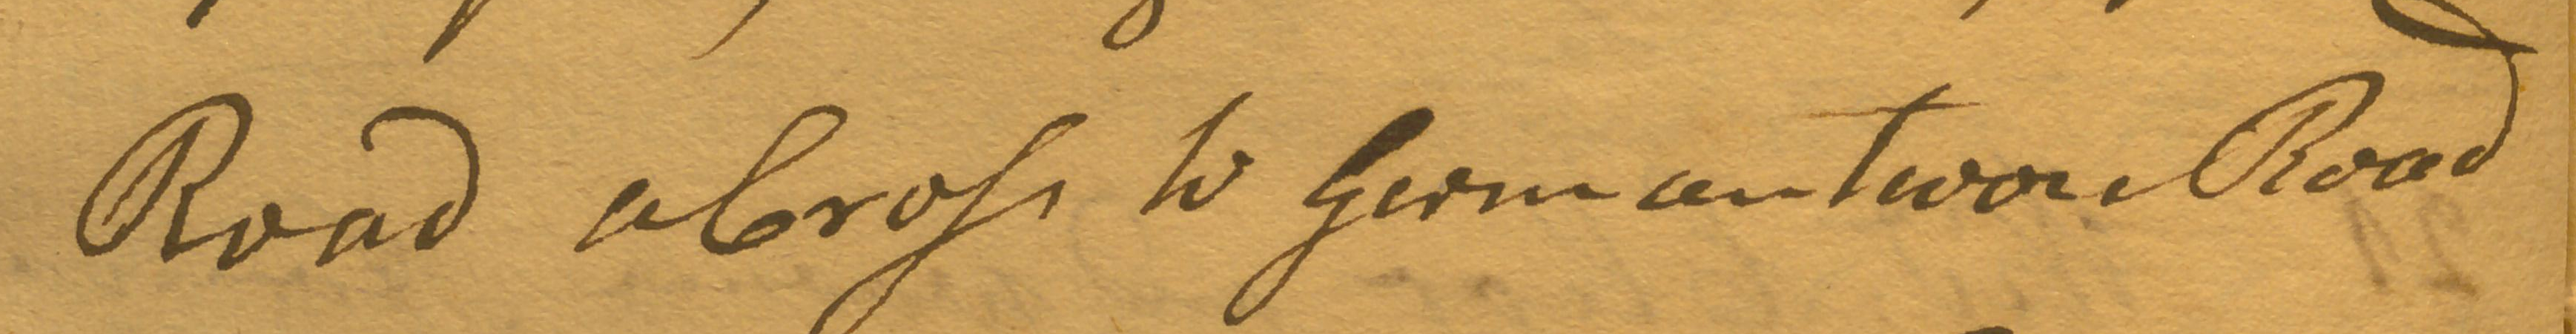Road a Cross to Germantwon Road
